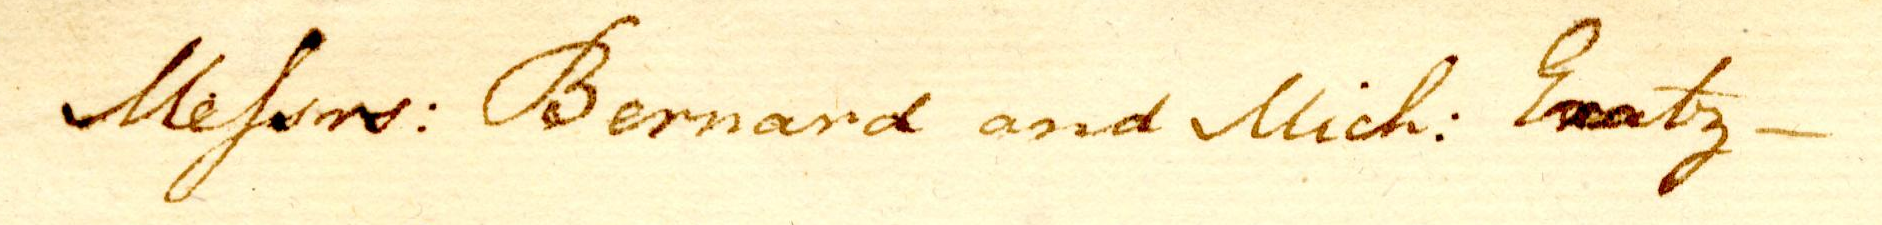Messers: Barnard and Mich: Gratz-
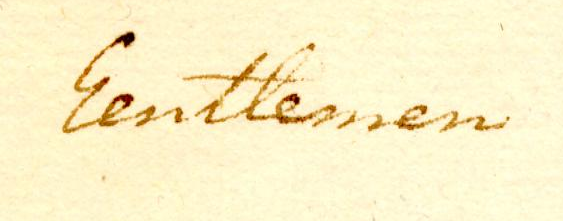Gentlemen
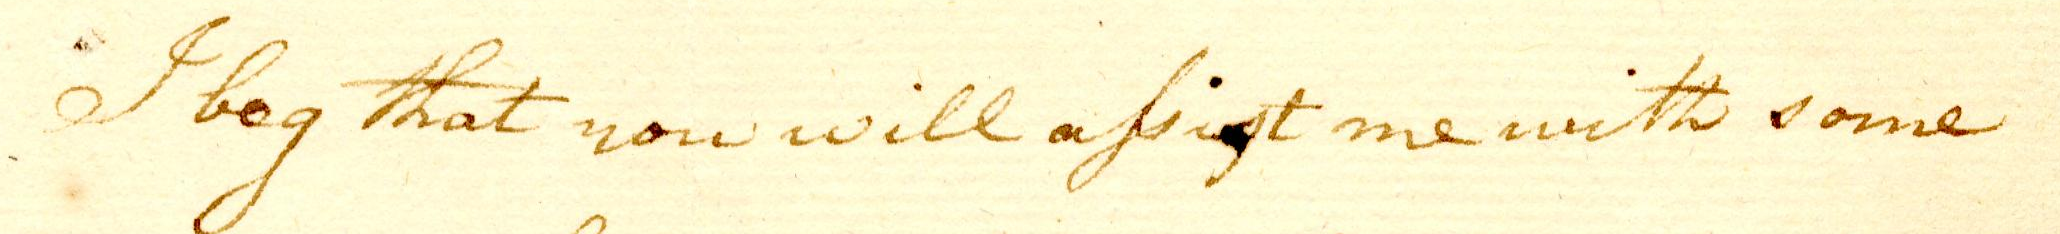I beg that you will assist me with some
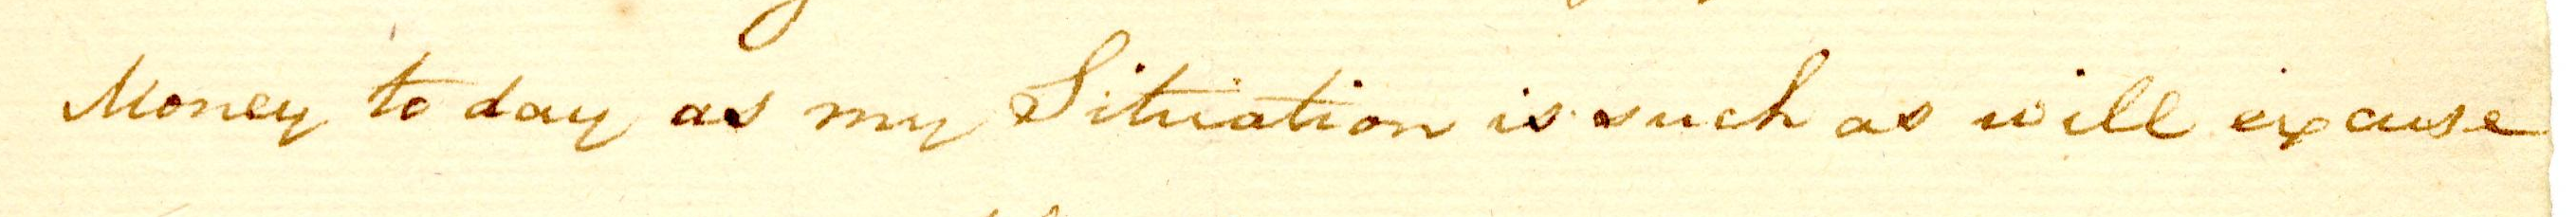Money to day as my Situation is such as will excuse
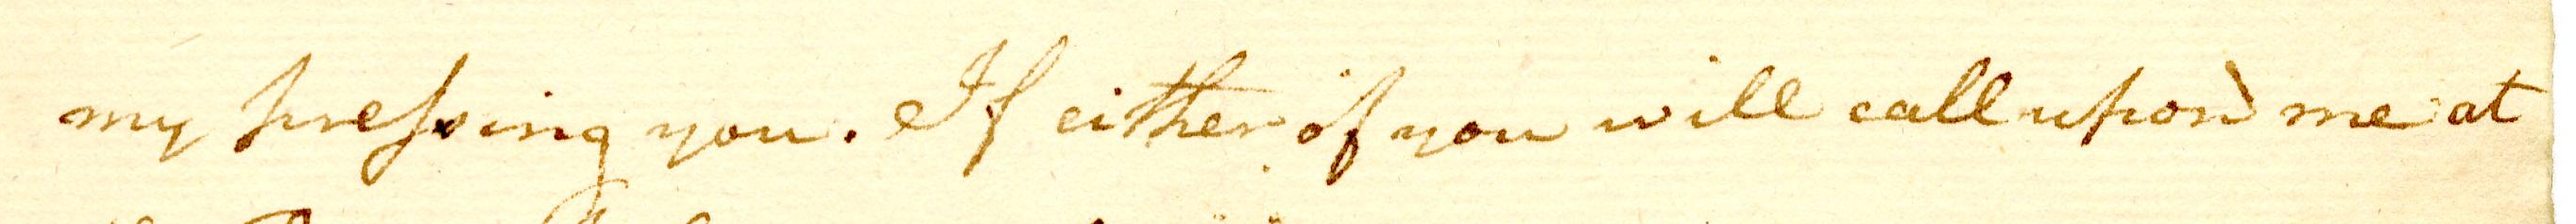my pressing you. If either of you will call upon me at
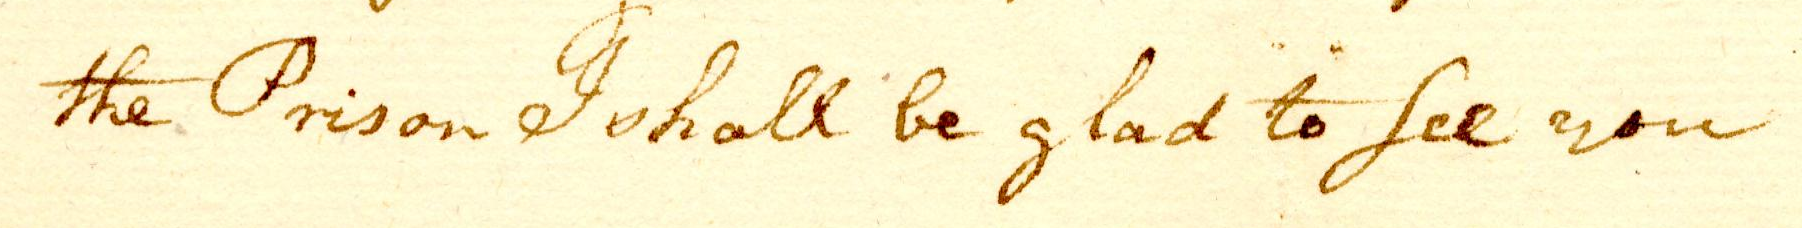the Prison I shall be glad to see you
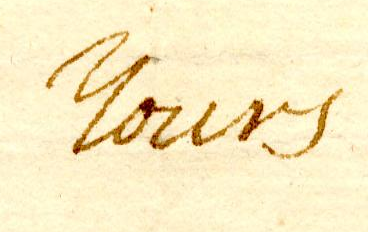Yours
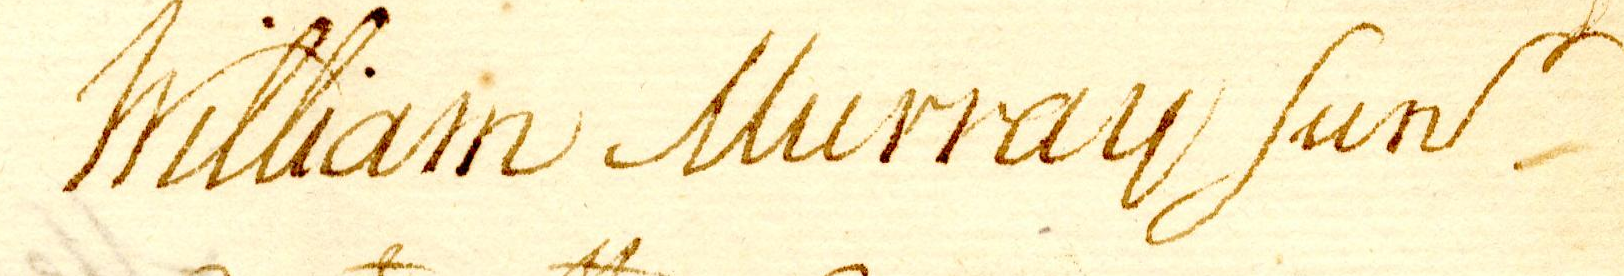William Murray Jun^r
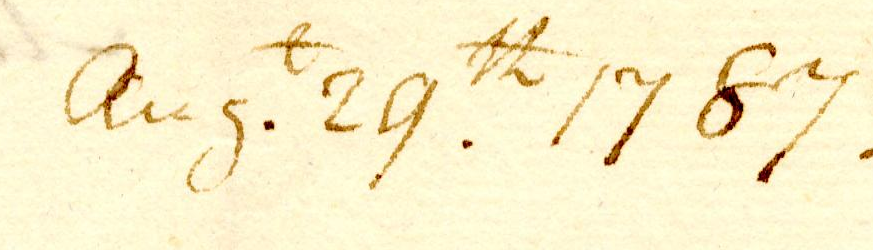Aug^t. 29.^th 1787
